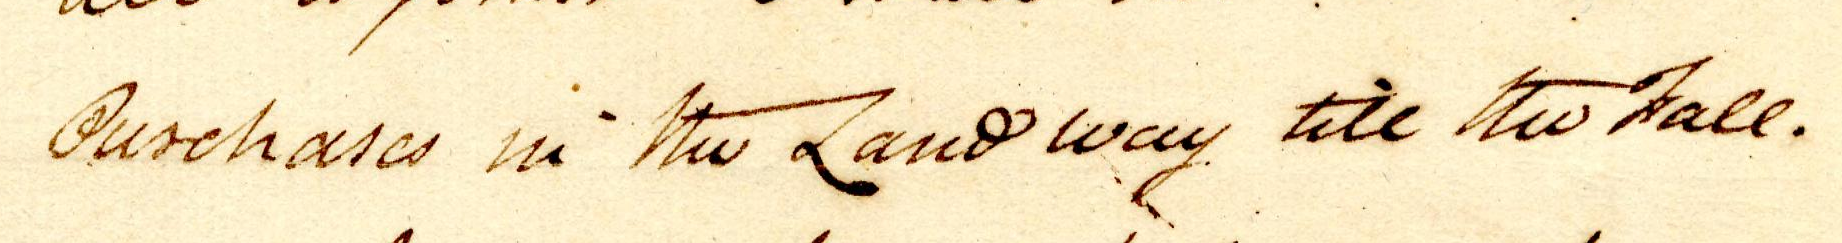Purchases in the Land way till the Fall
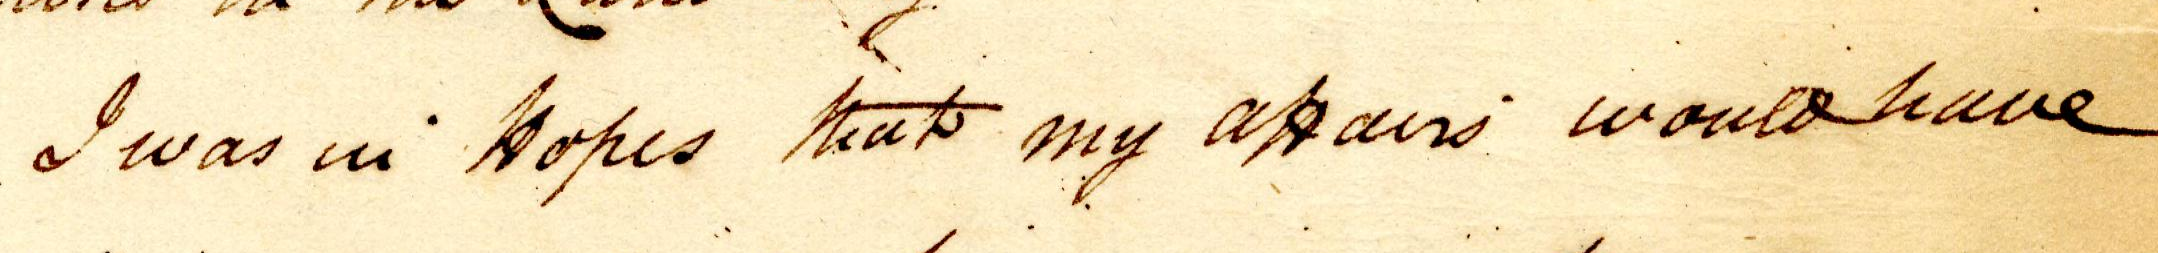I was in Hopes that my affairs would have
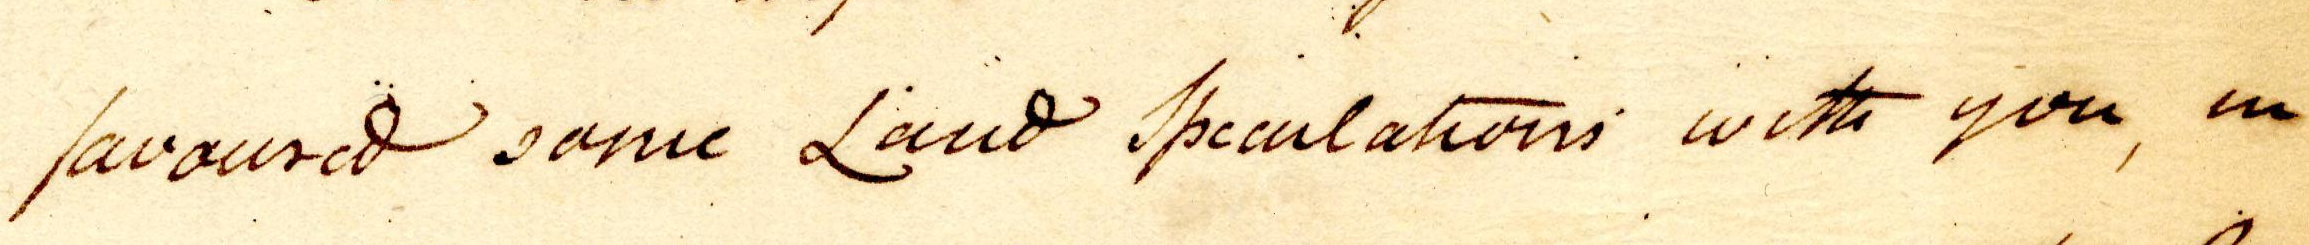favoured some Land Speculations with you, in
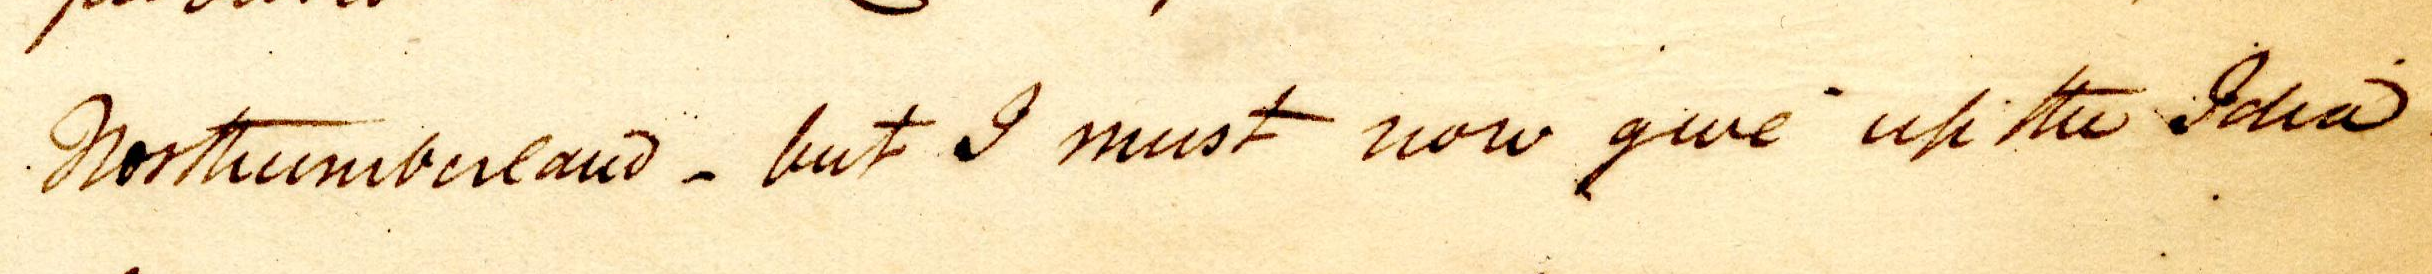Northumberland. but I must now give up the Idea
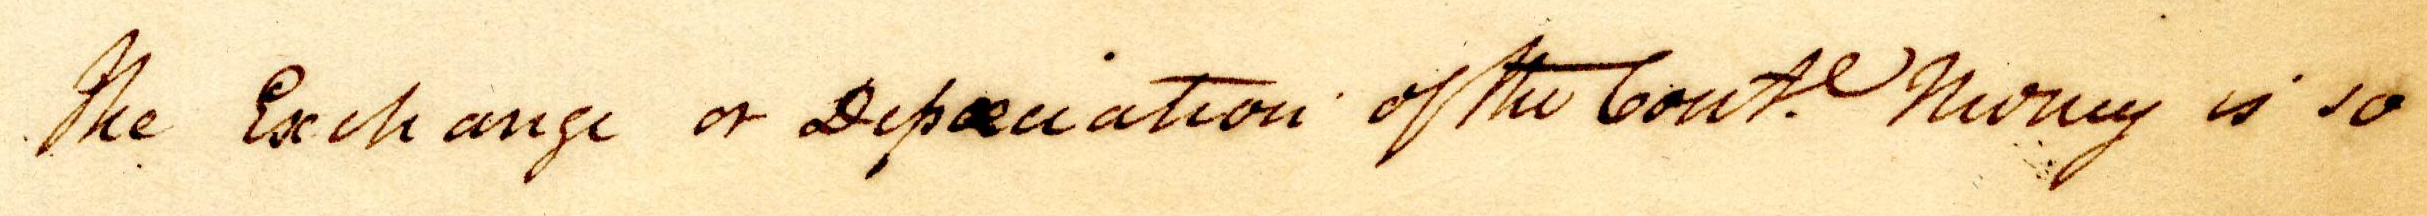the Exchange or Depreciation of the Cout^l. Nevrey is so
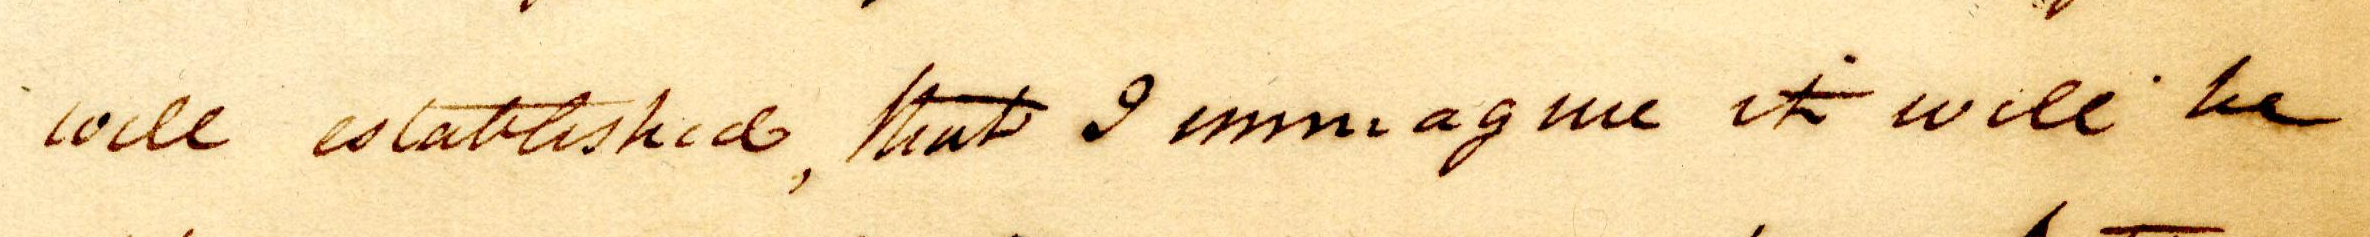well established that I immagine it will be
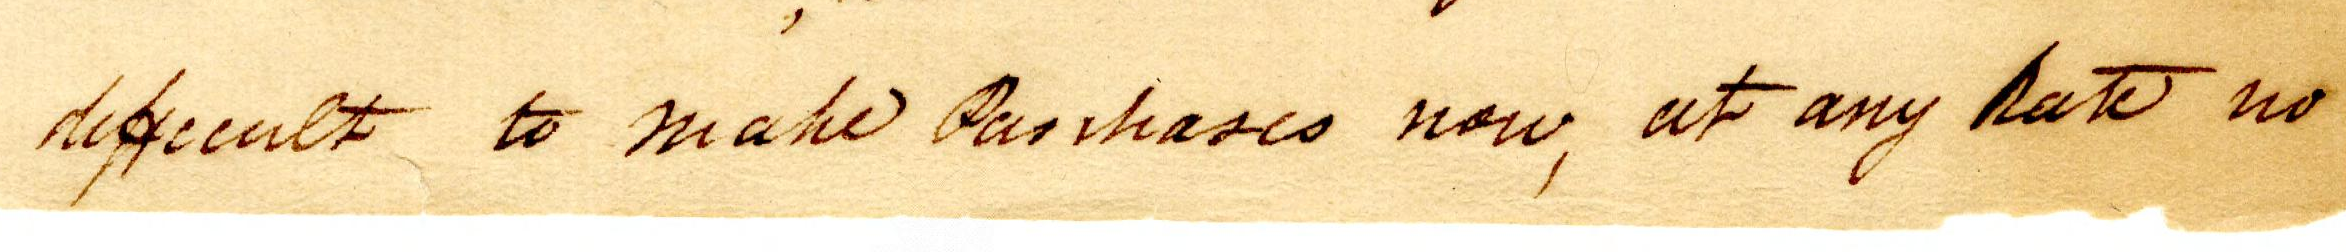difficult to make Purchases now, at any Rate no
